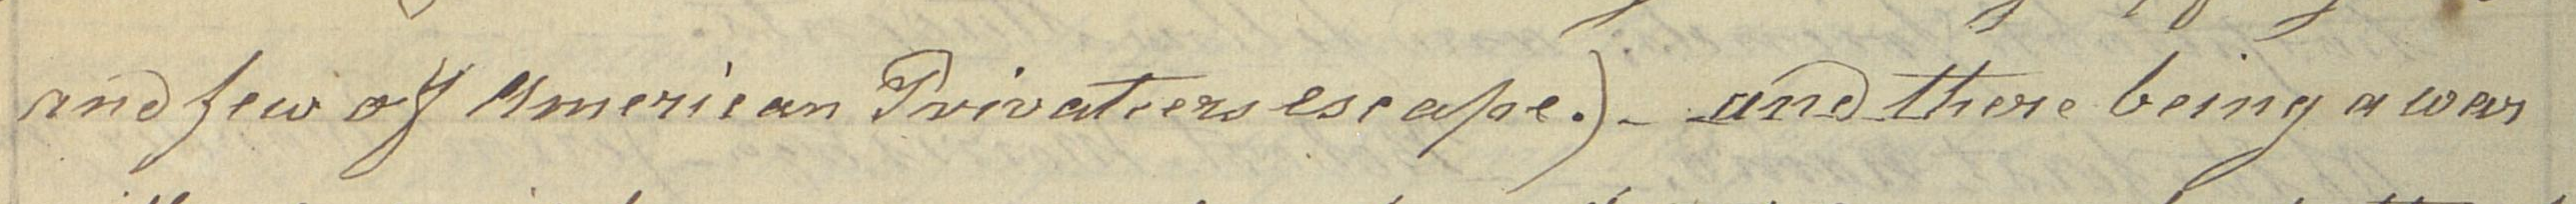and few of American Privatrers escape.) and there being a war
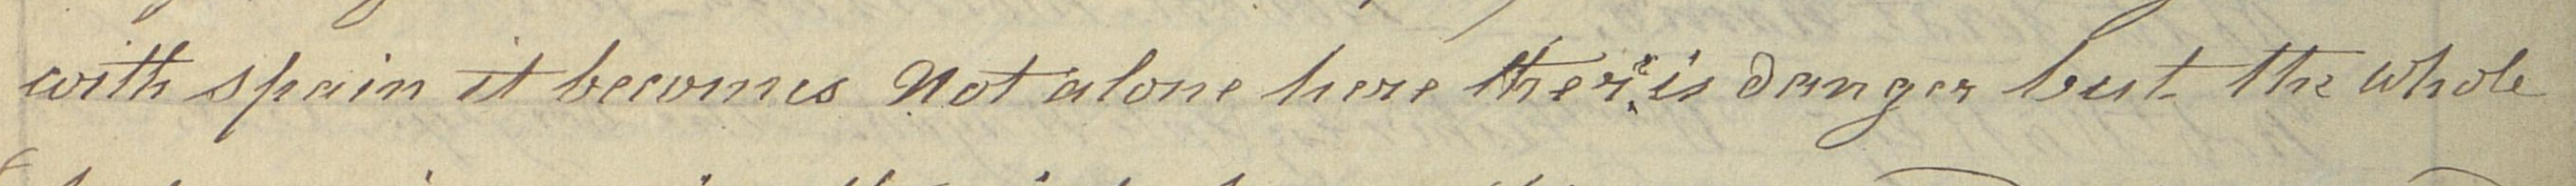with Spain it becomes not alone here there is danger but the whole
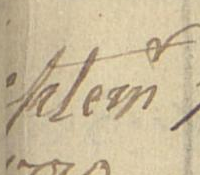ptem^r
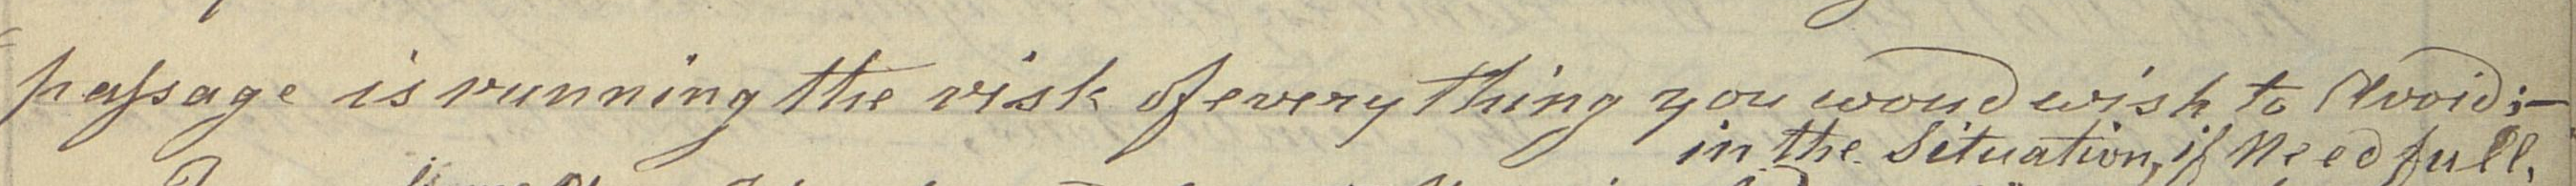passage is running the risk of every thing you woud wish to avoid;
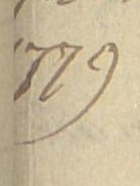1779
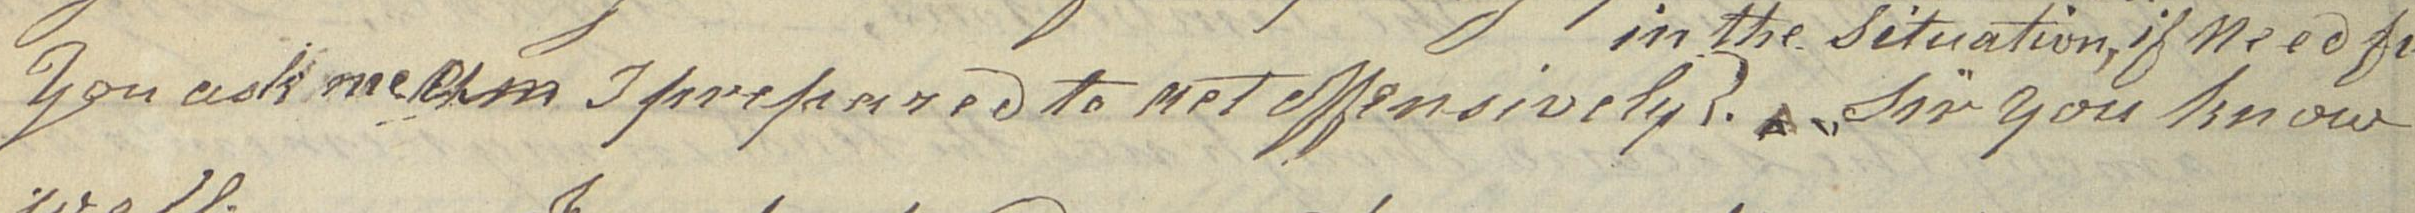You ask me am I prepared to not offensively? "Sir you know
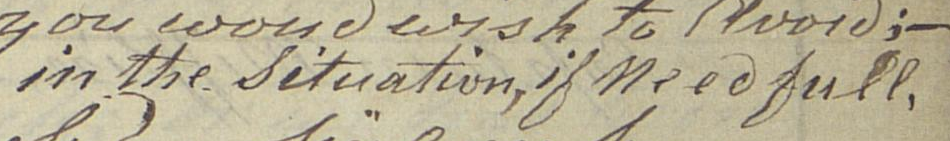in the Situation if need full,
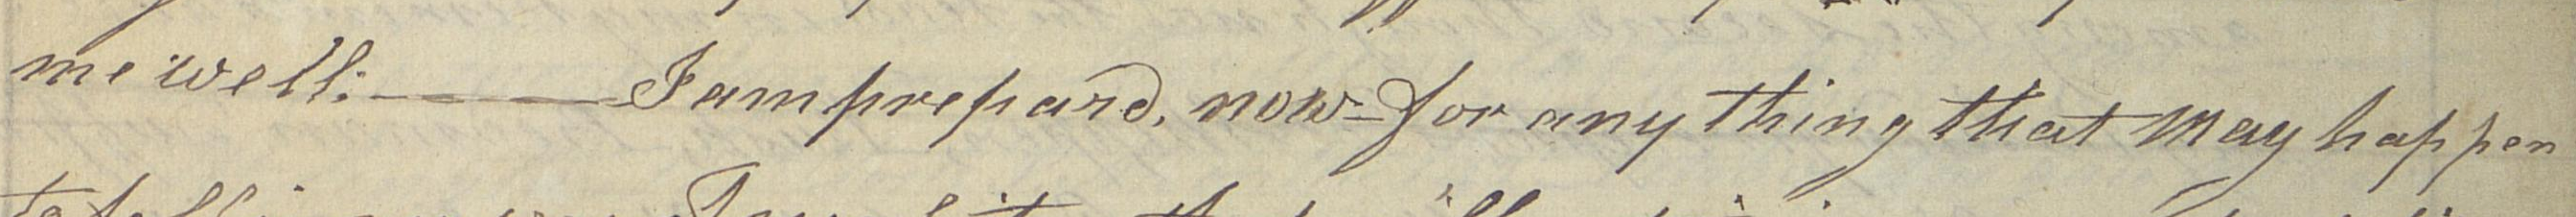me well. I am prepard now for any thing that May happen
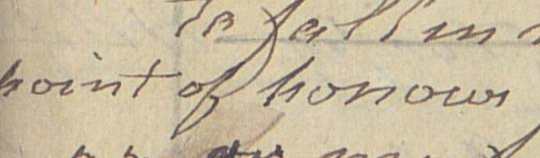point of honour
